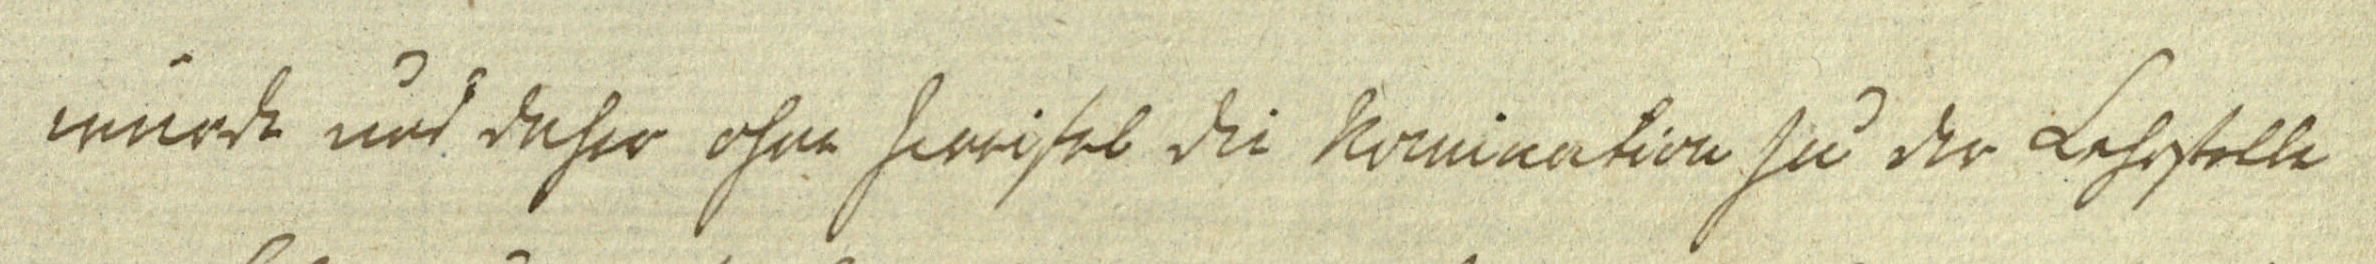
würde und daher ohne Zweifel die Nomination zu der Lehrstelle
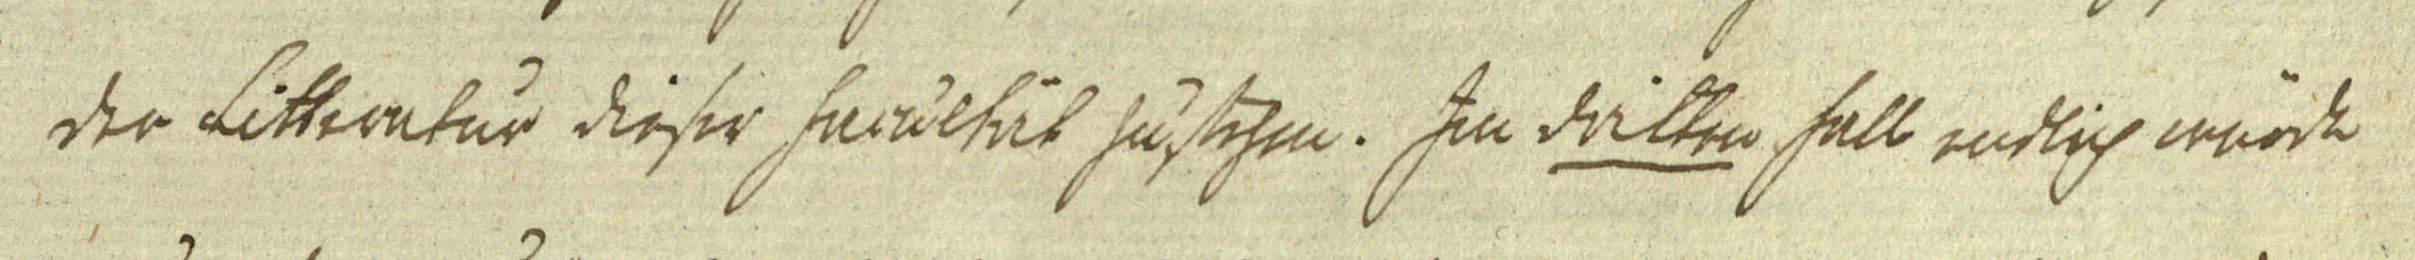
der Litteratur dieser Facultät zustehen. In dritten Fall endlich würde
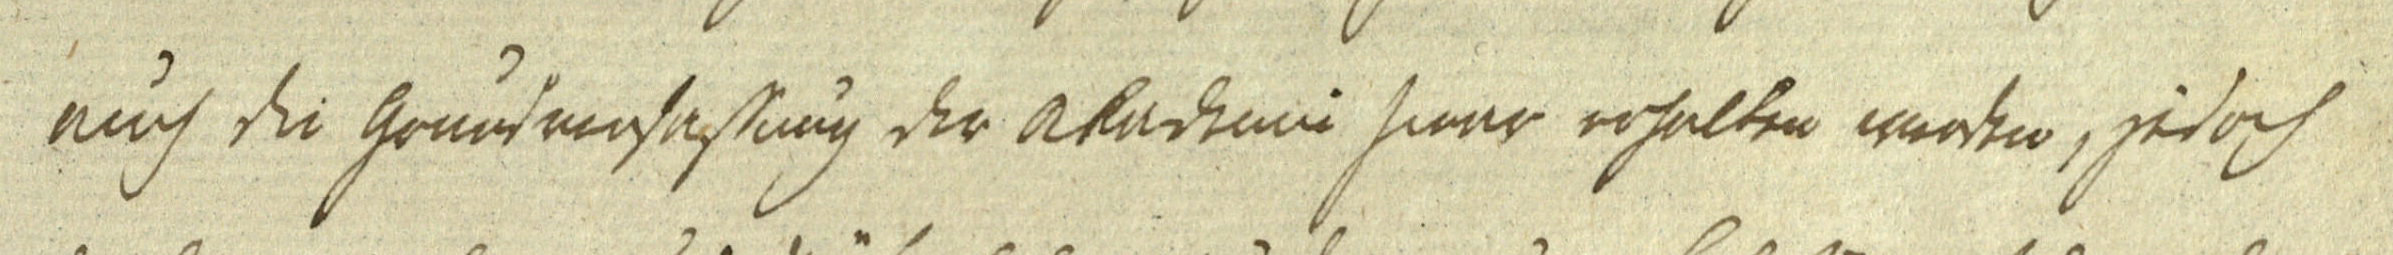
auch die Grundverfassung der Akademie zwar erhalten werden, jedoch
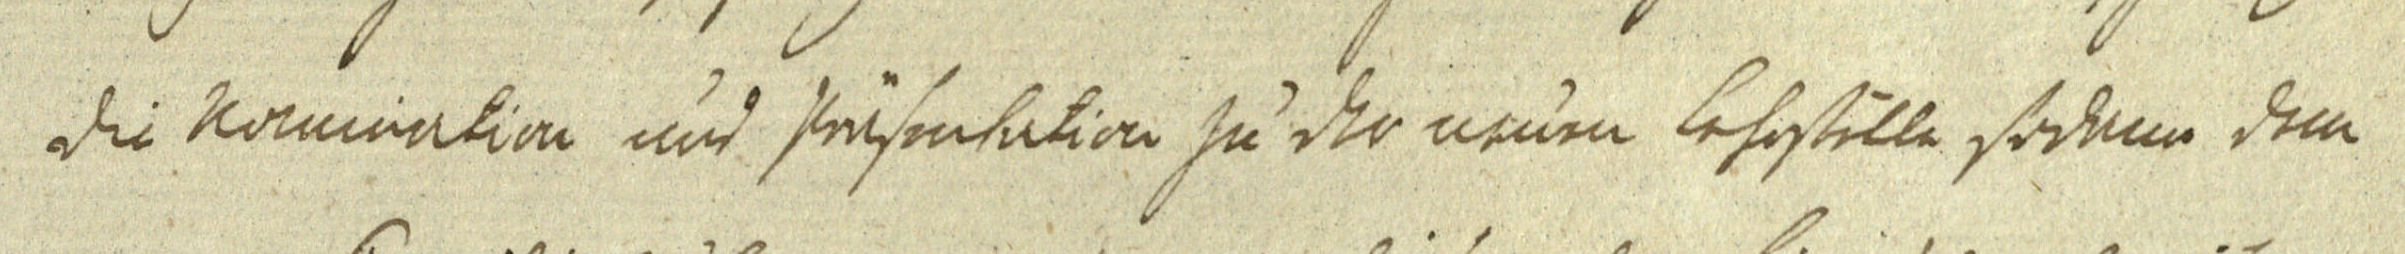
die Nomination und Präsentation zu der neuen Lehrstelle sodann dem
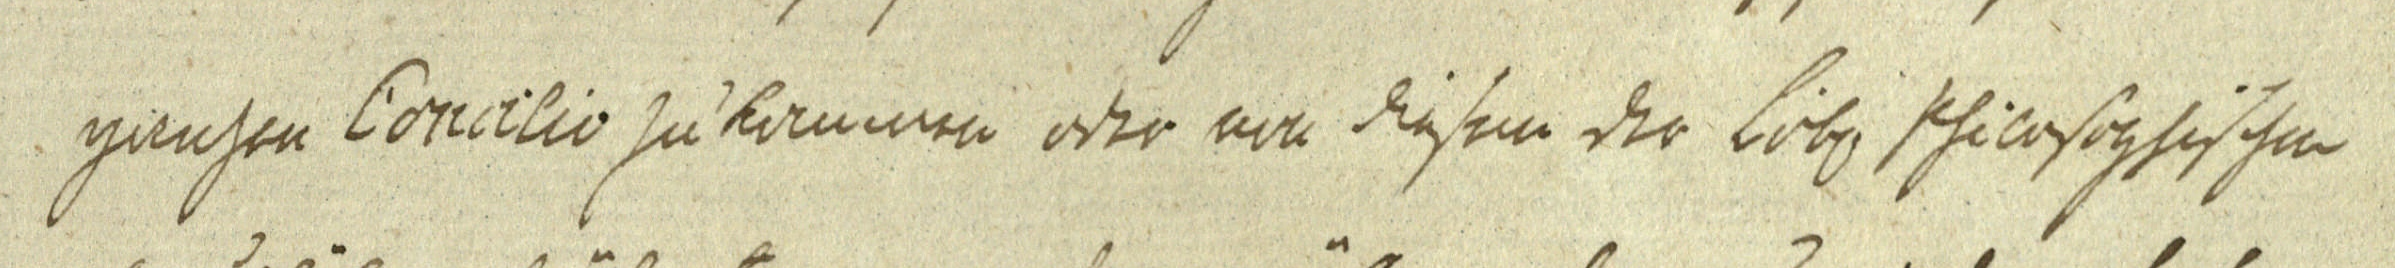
ganzen Concilio zukommen oder von diesem der Löb. Philosophischen
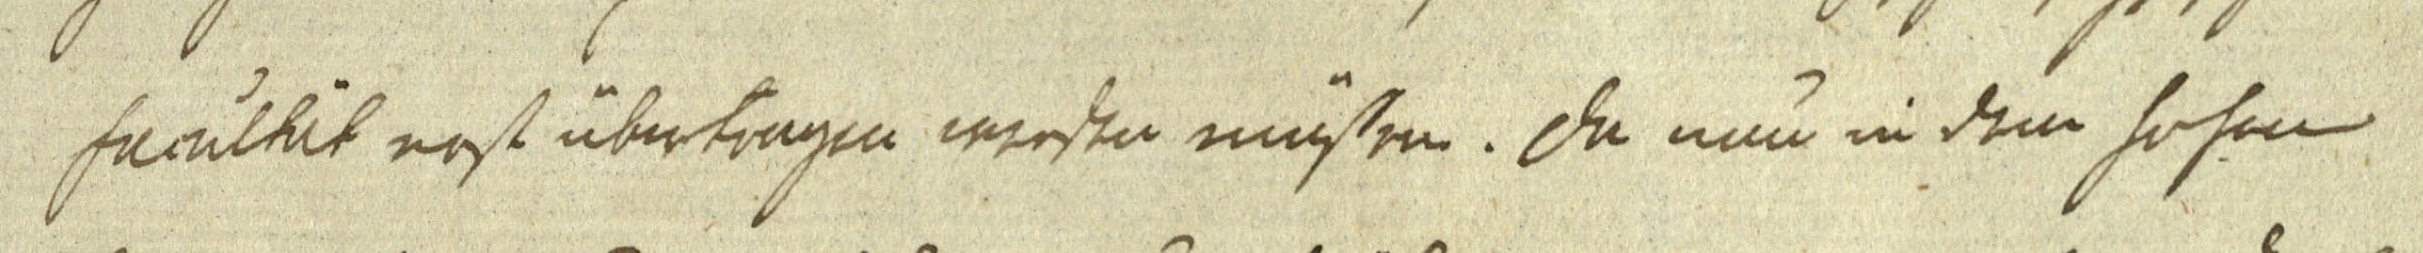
Facultät erst übertragen werden müssen. Da nun in dem hohen
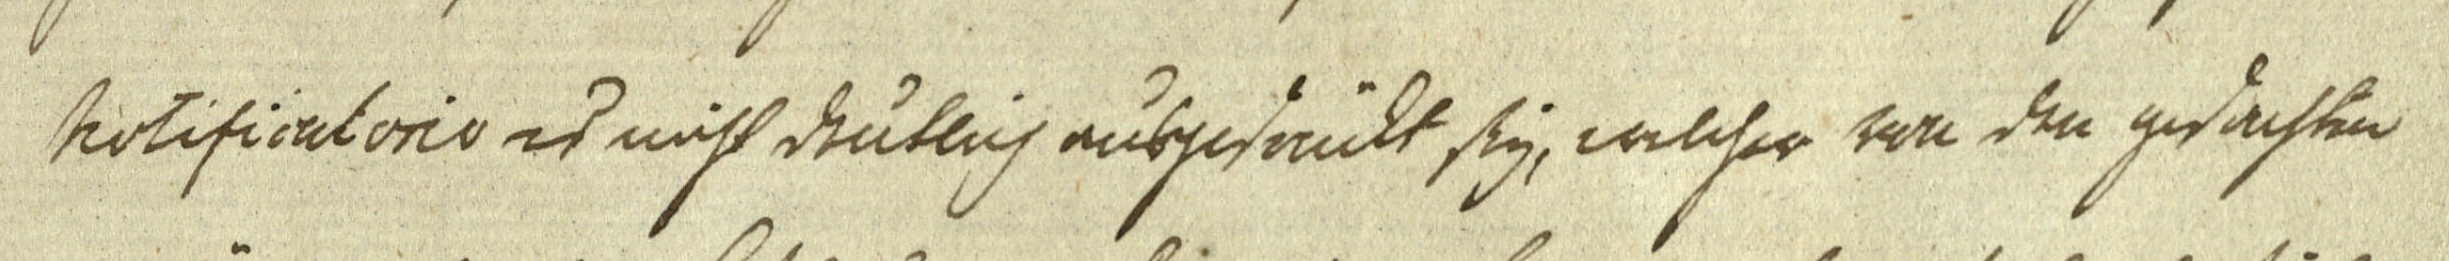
Notificatorio esad nicht deutlich ausgedrückt seÿ, welcher von den gedachten
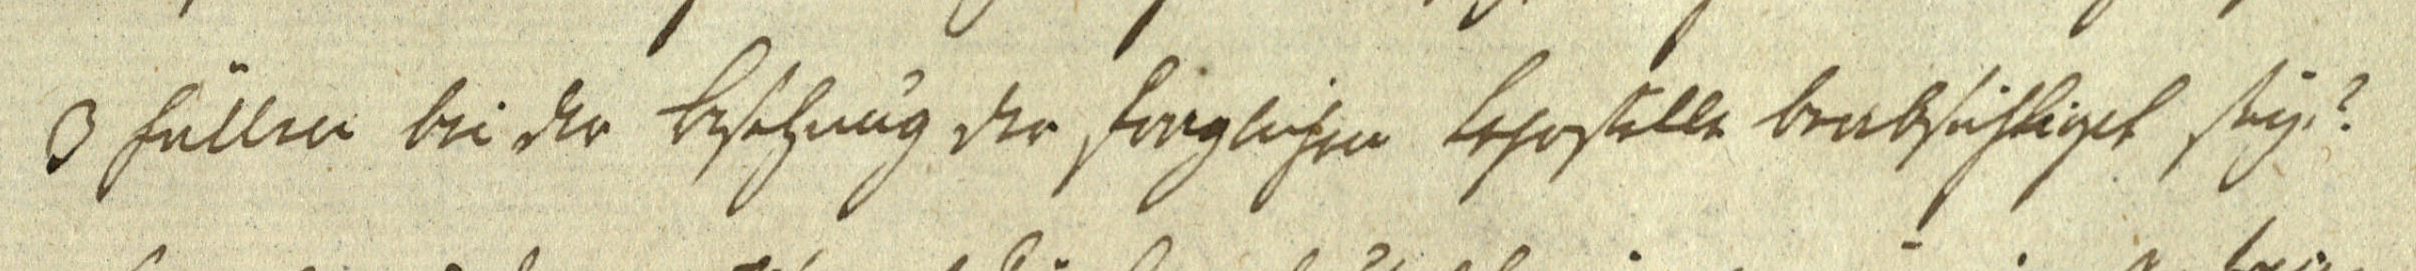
3 Fällen bei der Besetzung der fraglichen Lehrstelle beabsichtiget seÿ?
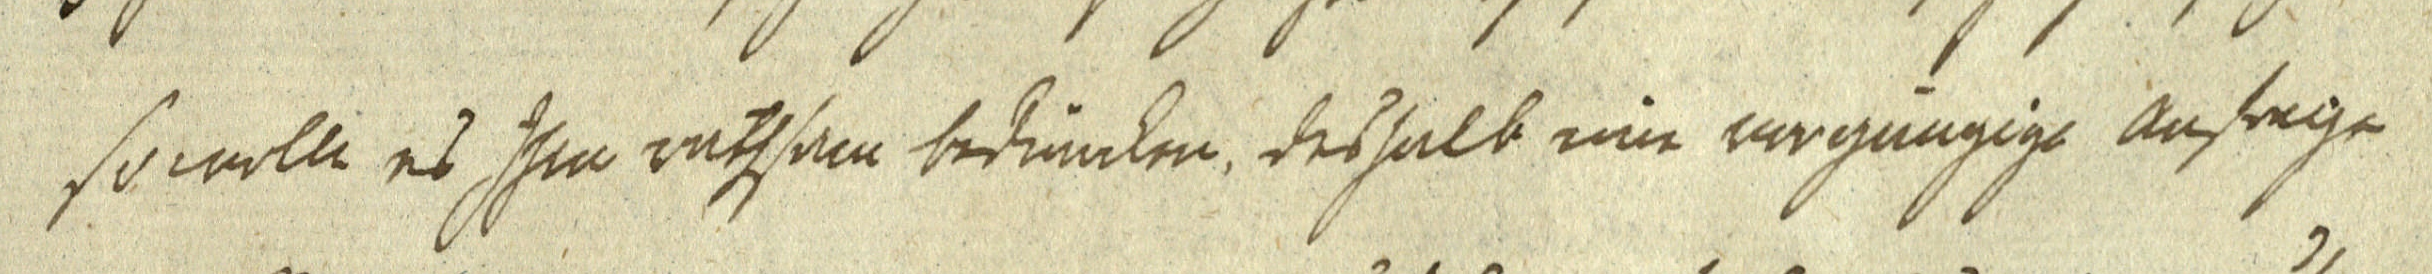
so wolle es Ihm rathsam bedüncken, deshalb eine vorgängige Anfrage
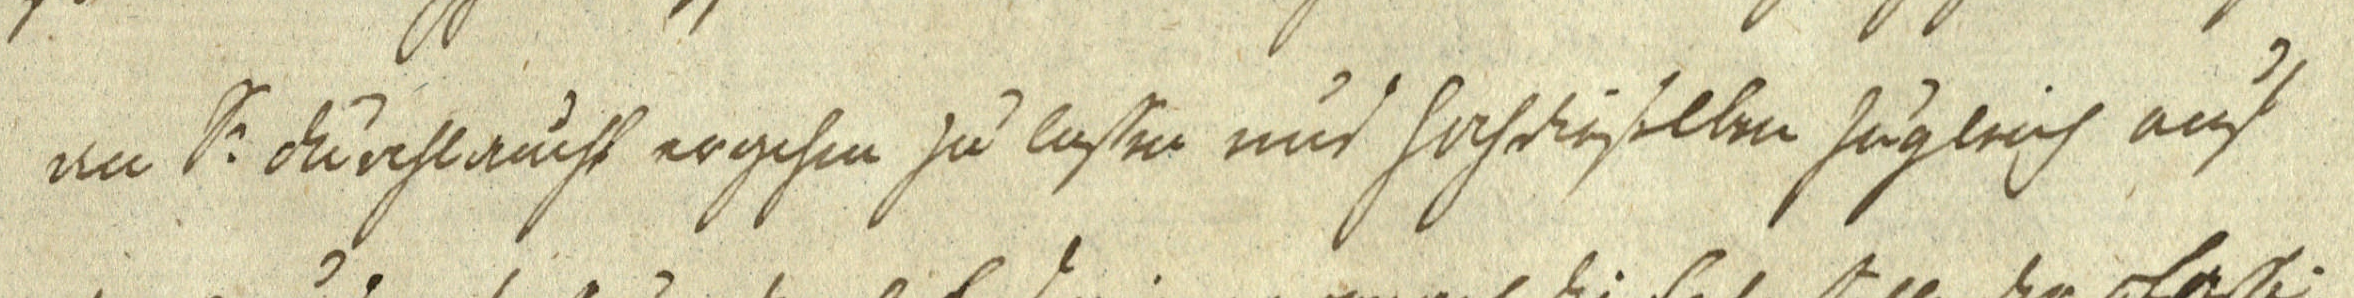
an Sr Durchlaucht ergehen zu lassen und hochdieselben zugleich auf
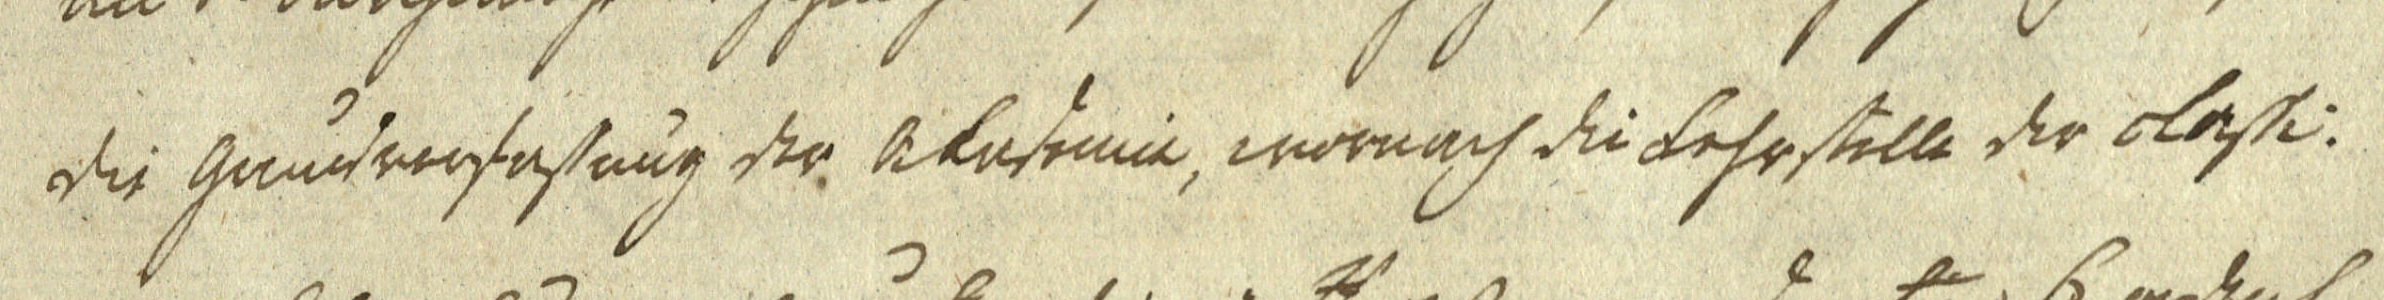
die Grundverfassung der Akademie, wornach die Lehrstelle der classi¬
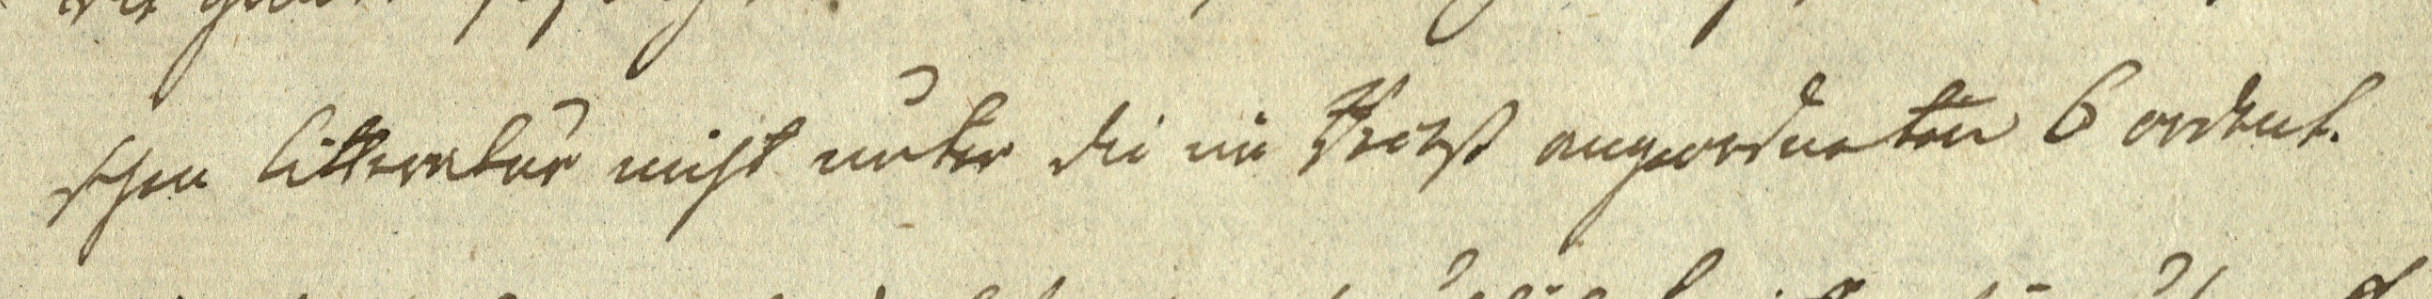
schen Litteratur nicht unter die im Receß angeordneten 6 ordent¬
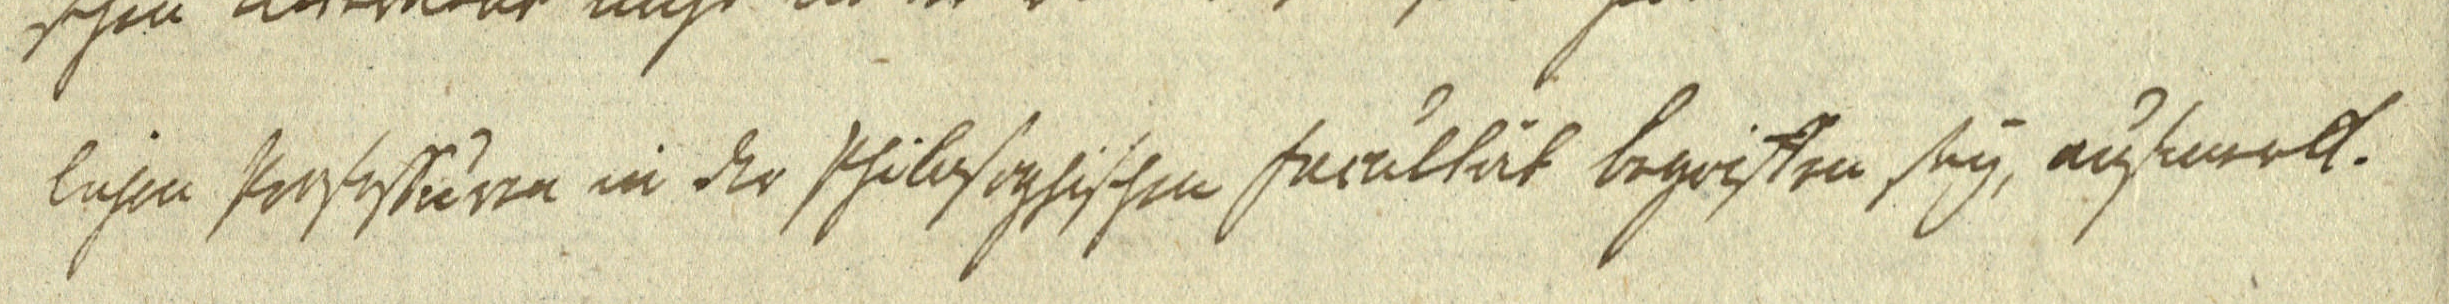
lichen Professuren in der Philosophischen Facultät begriffen seÿ, aufmerk¬
